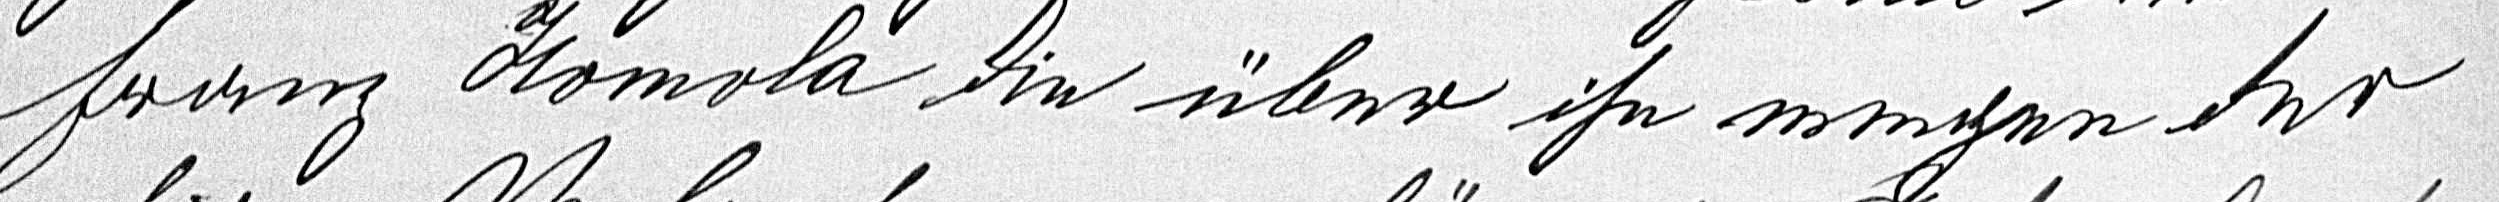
Franz Homola die über ihn wegen der
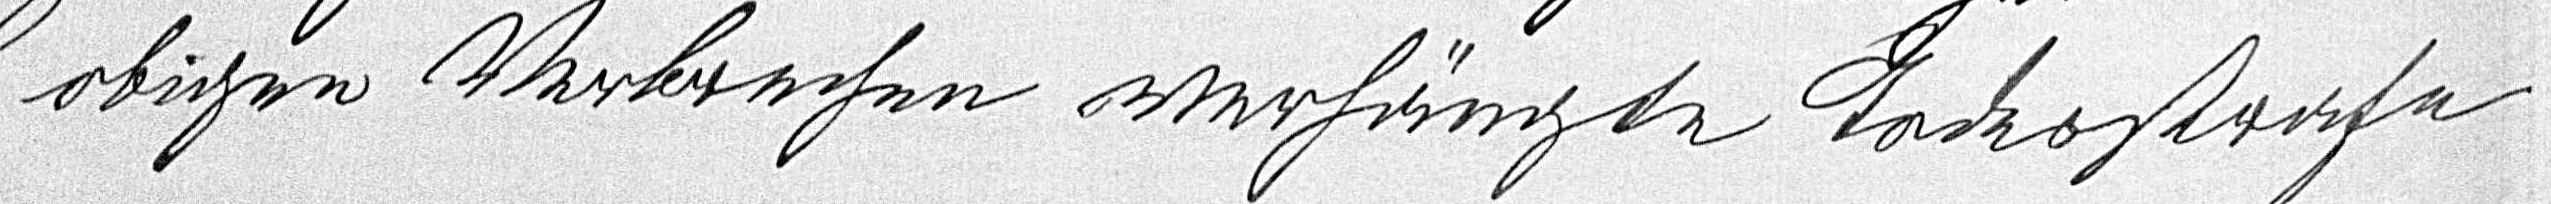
obigen Verbrechen verhängte Todesstrafe
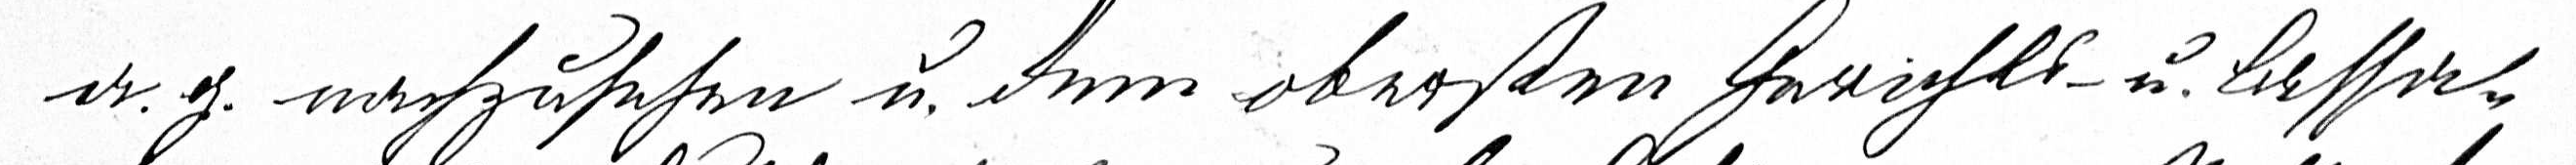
a.g. nachzusehen u. dem obersten Gerichts- u. Cassa¬
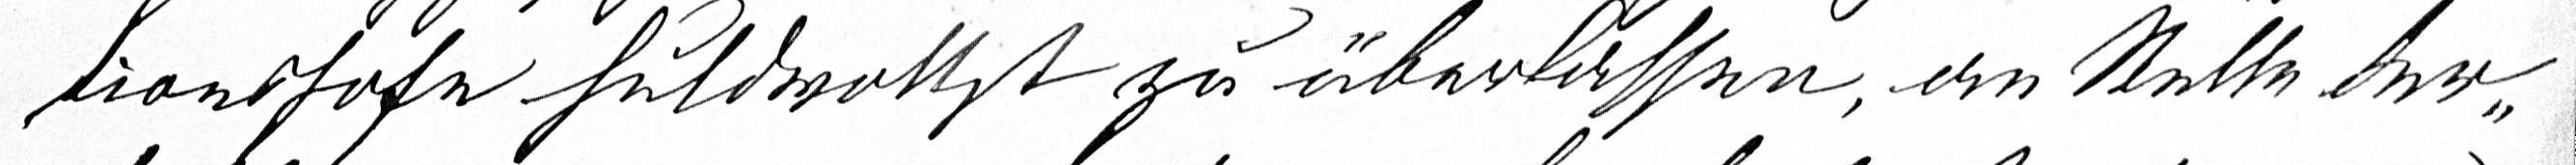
tionshofe huldvollst zu überlassen, an Stelle der¬
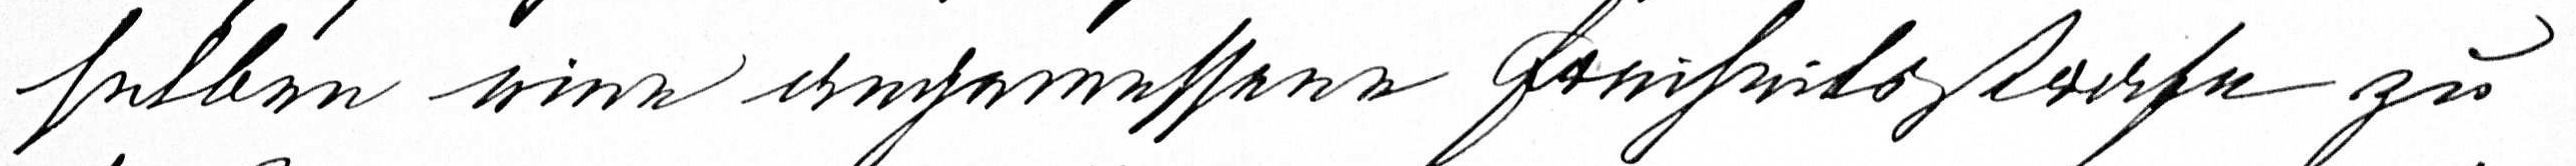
selben eine angemessene Freiheitsstrafe zu
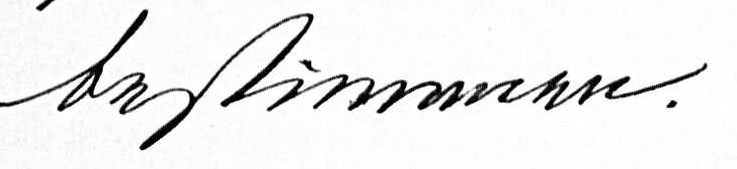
bestimmen.
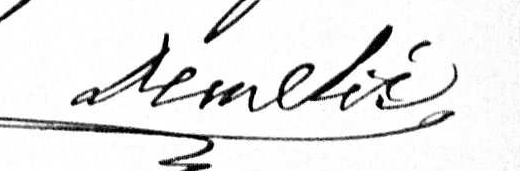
Demelić
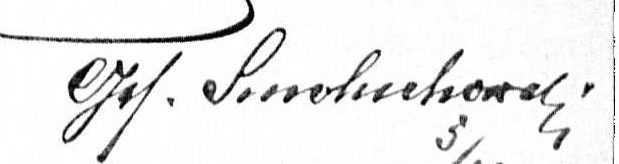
Ges. Smoluchowski
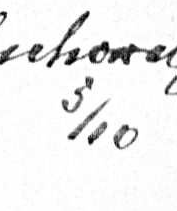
3/10
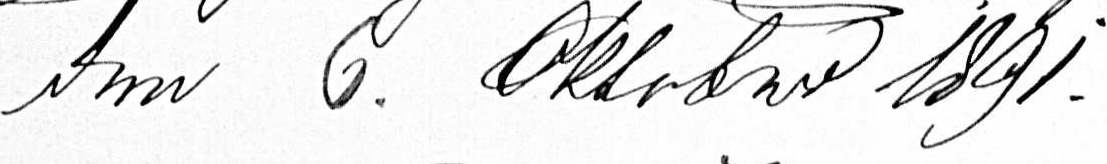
den 6. Oktober 1891
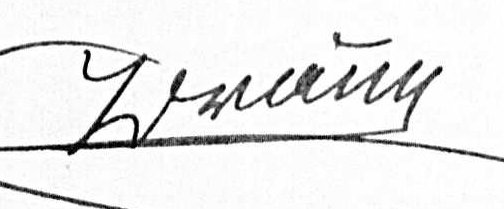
Braun
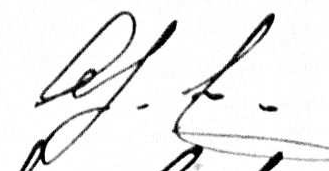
Ah E.
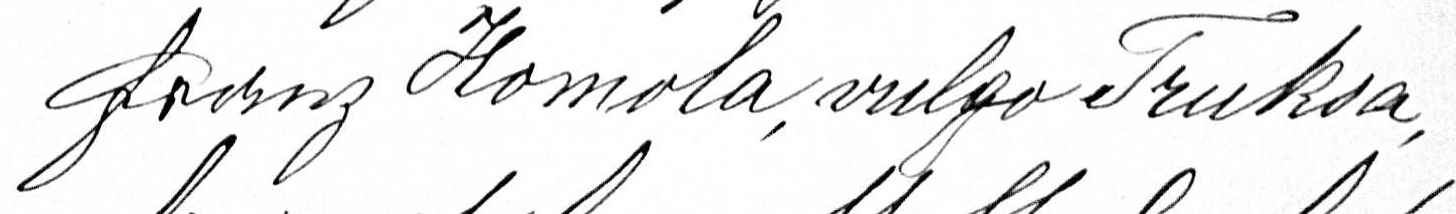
Franz Homola, vulgo Truksa,
